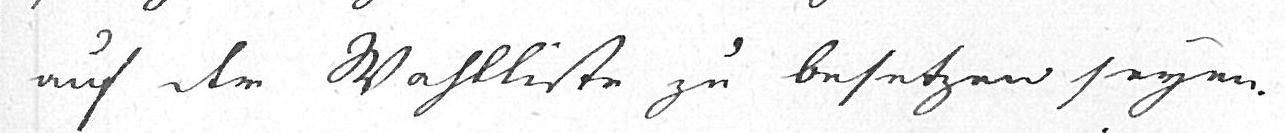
auf der Wahlliste zu besetzen seyen.
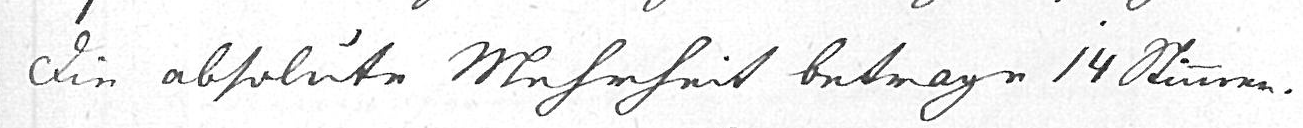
Die absolute Mehrheit betrage 14 Stimmen.
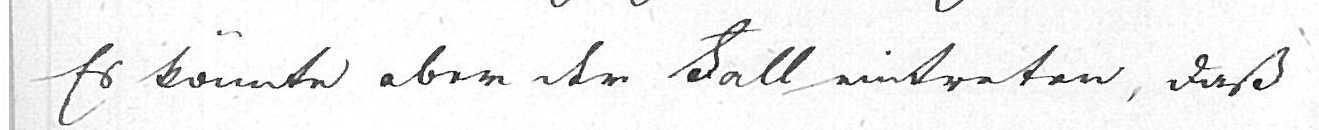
Es könnte aber der Fall eintreten, daß
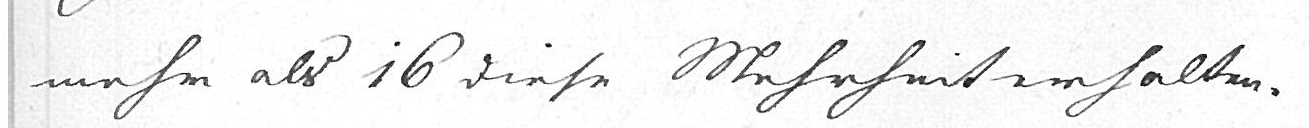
mehr als 16 diese Mehrheit erhalten.
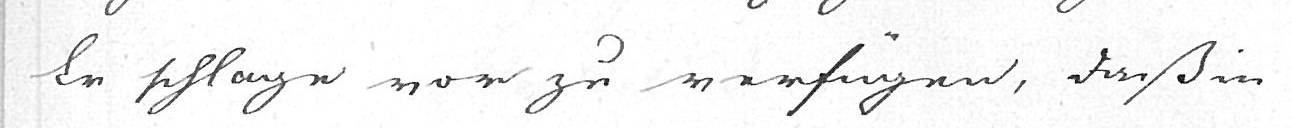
Er schlage vor zu verfügen, daß in
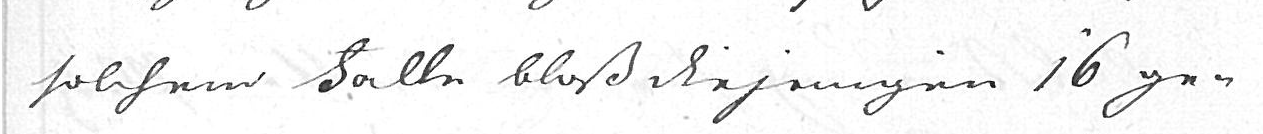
solchem Falle bloß diejenigen 16 ge-
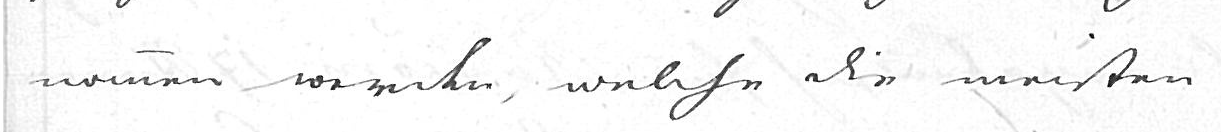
nommen werden, welche die meisten
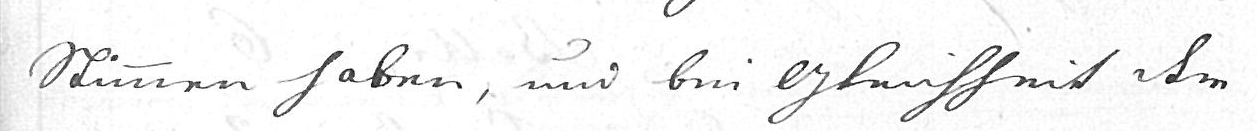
Stimmen haben, und bei Gleichheit der
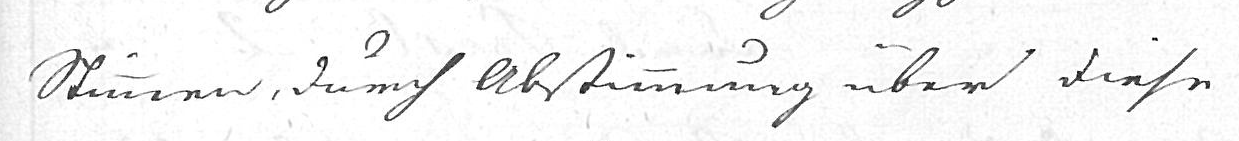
Stimmen, durch Abstimmung über diese
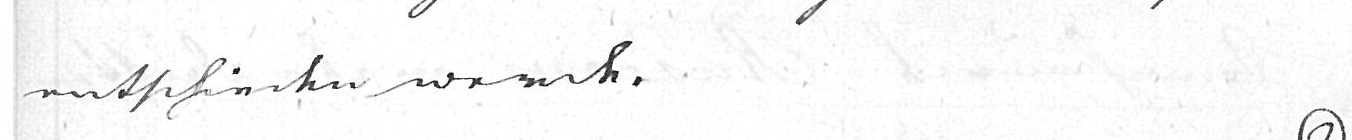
entschieden werde.
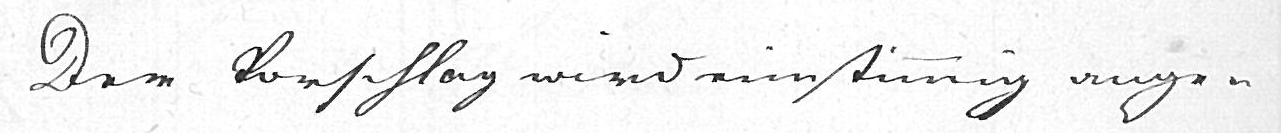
Der Vorschlag wird einstimmig ange-
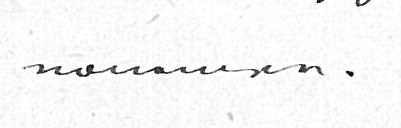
nommen.
